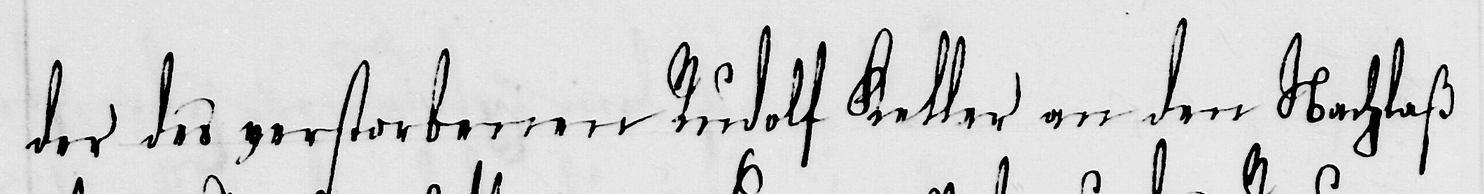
der des verstorbenen Rudolf Keller an den Nachlaß
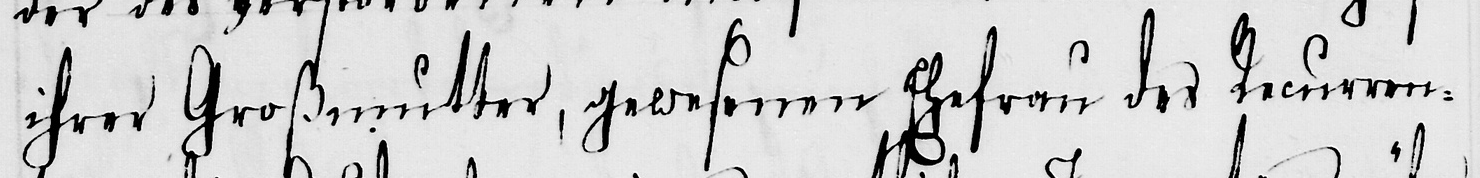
ihrer Großmutter, gewesenen Ehefrau des Recurren¬
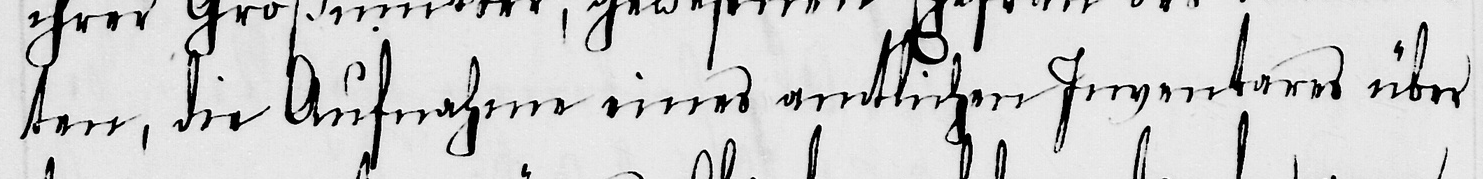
ten, die Aufnahme eines amtlichen Inventares über
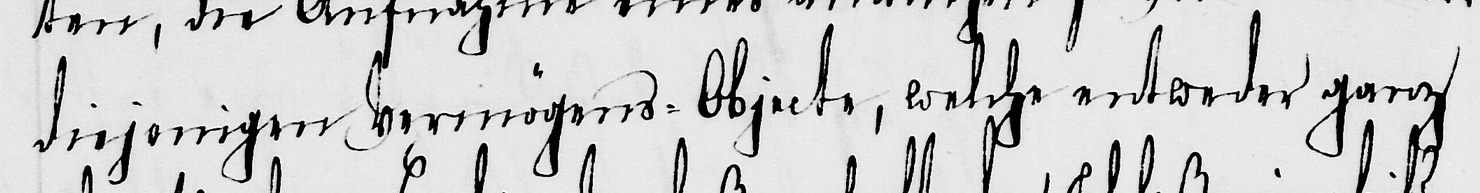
diejenigen Vermögens-Objecte, welche entweder ganz
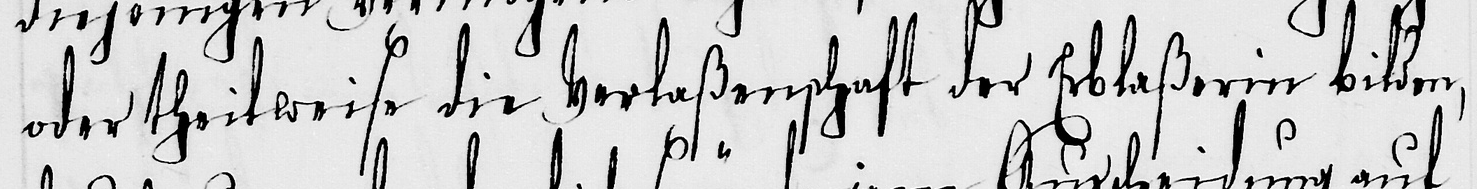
oder theilweise die Verlaßenschaft der Erblaßerin bilden,
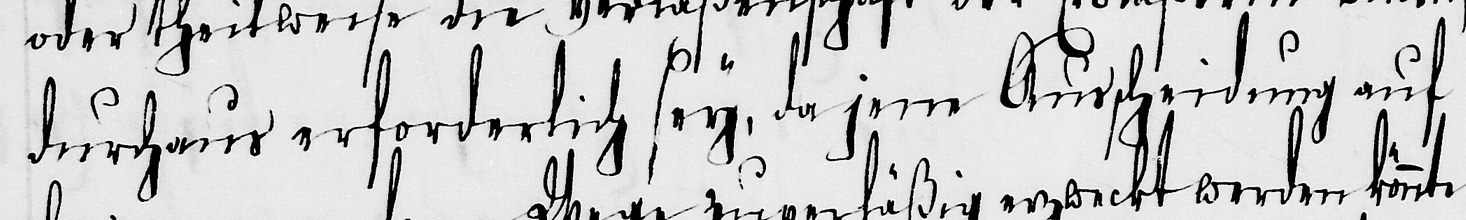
durchaus erforderlich sey, da jene Ausscheidung auf
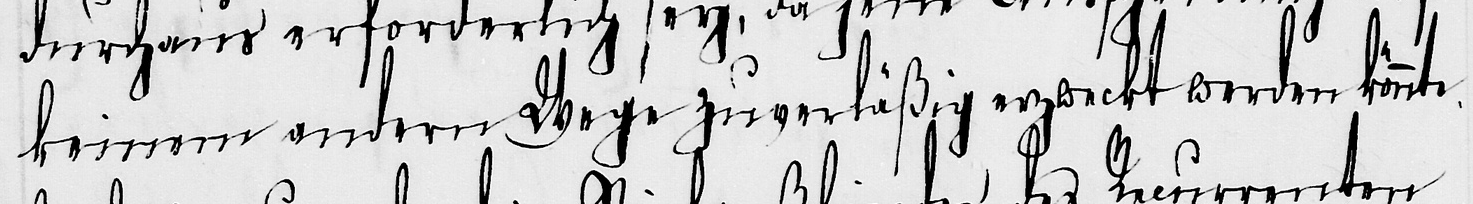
keinem andern Wege zuverläßig erzweckt werden könn¬
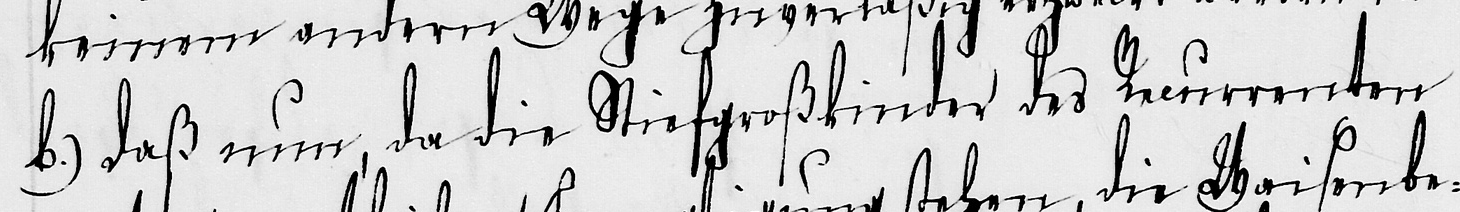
b.) daß nun, da die Stiefgroßkinder des Recurrenten
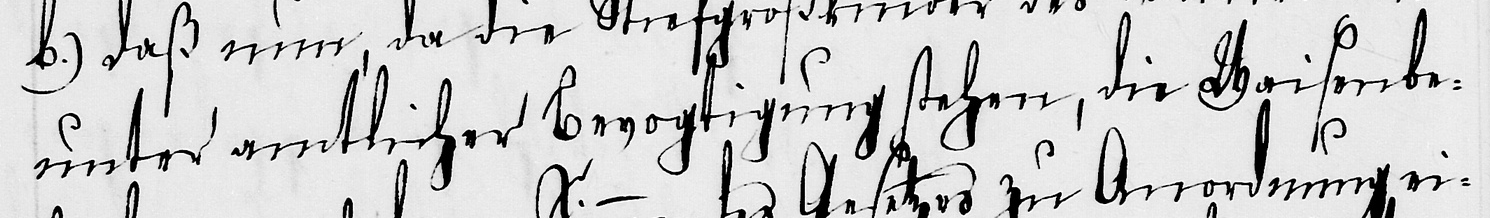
unter amtlicher Bevogtigung stehen, die Waisenbe¬
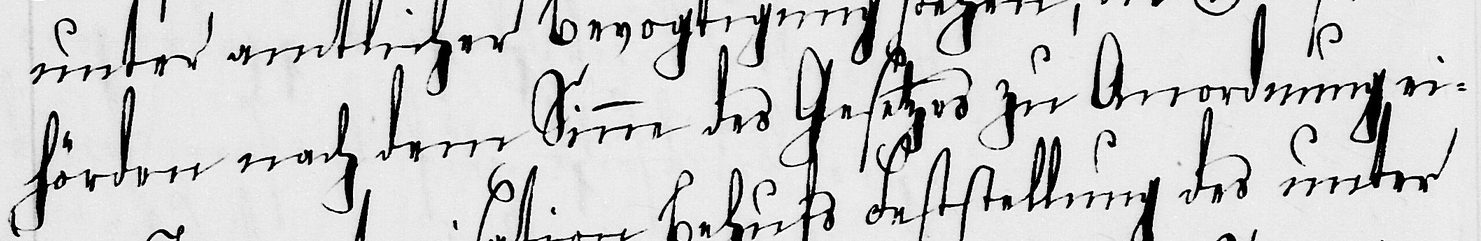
hörden nach dem Sinne des Gesetzes zu Anordnung ei¬
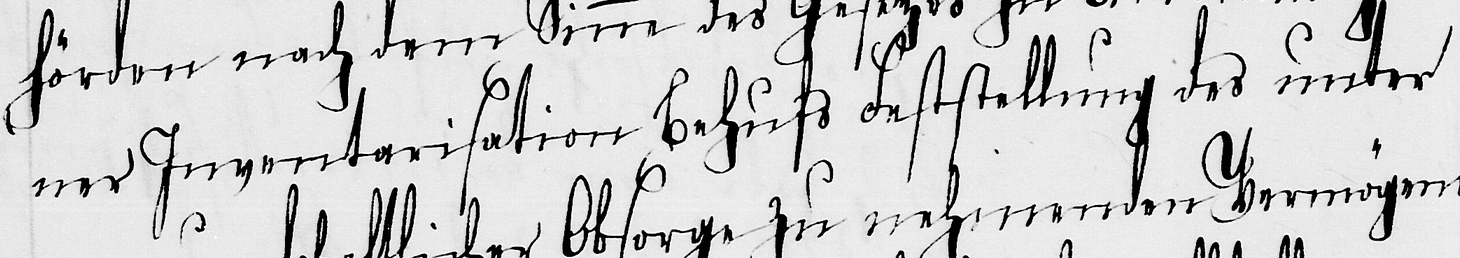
ner Inventarisation Behufs Feststellung des unter
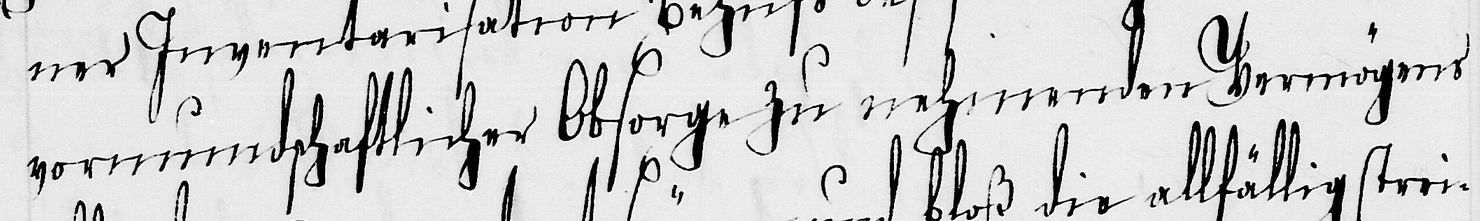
vormundschaftlicher Absorge zu nehmenden Vermögens
